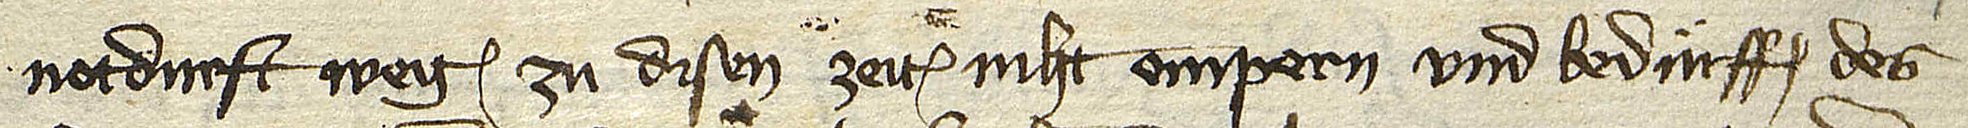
notdurft weg* ʒu diſen ʒeit* niht empern vnd bedürff* des
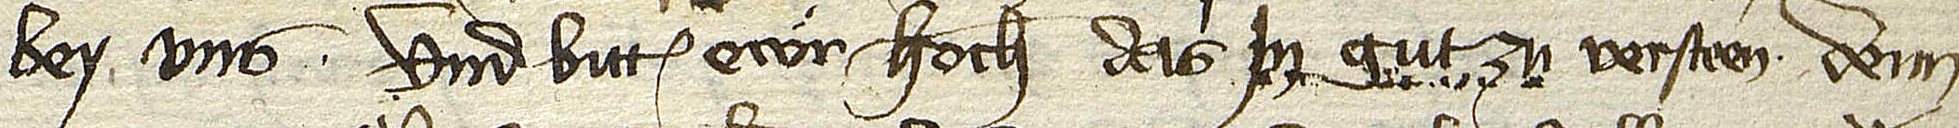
bey vns . Vnd bitt* ewr hoch* das In gut ʒu verſteen . Denn
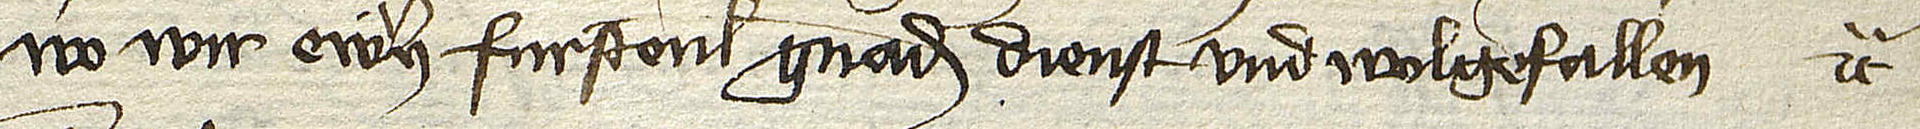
wo wir ewn* furſtenl* gnad* dienſt vnd wolgefallen ec*
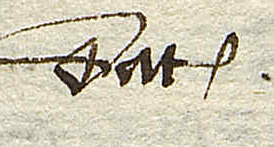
Dat*
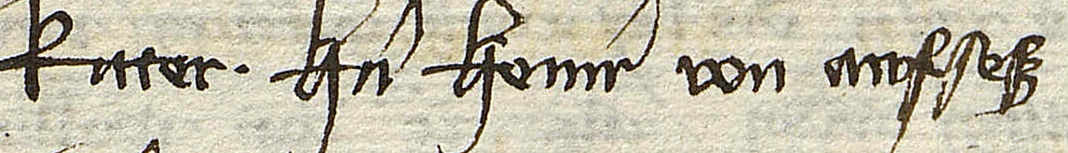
Ritter . H*n Heinr* von awfſeſʒ
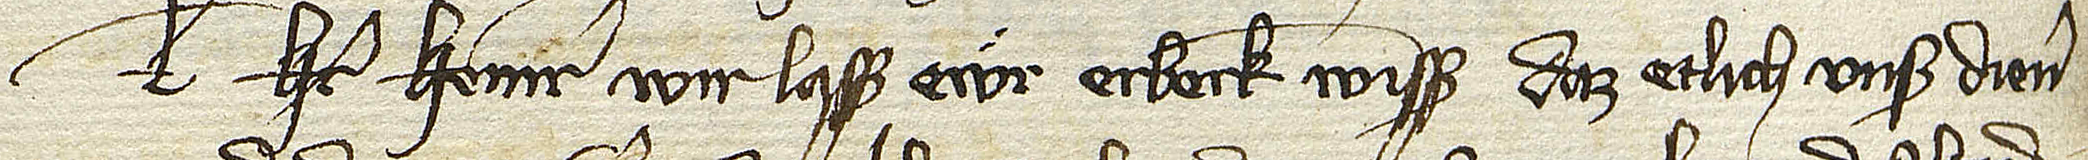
L* H*r Heinr* wir laſſ* ewr erberk* wiſſ* daʒ etlich vnſ* dien*
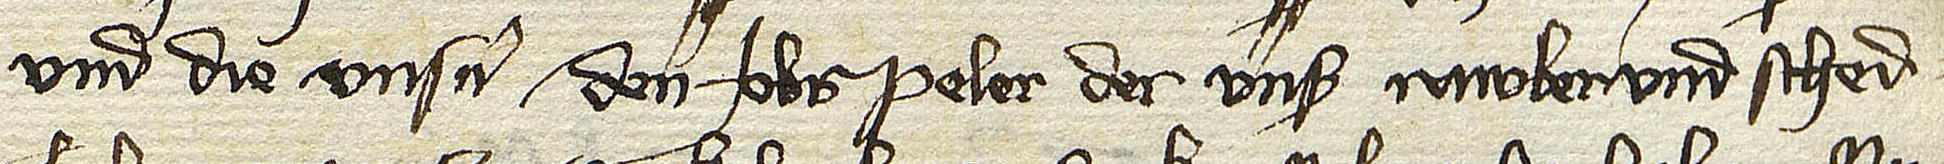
vnd die vnſ*n / den Iobs Peler der vnſ* rawber vnd ſched =
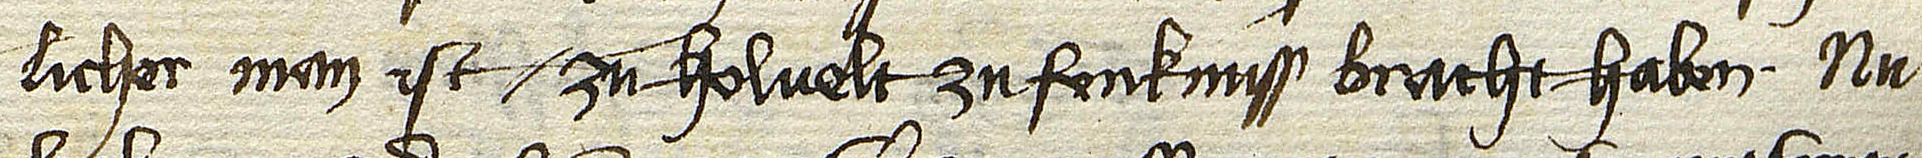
licher man iſt / ʒu holuelt ʒu fenknuſſ bracht haben . Nu
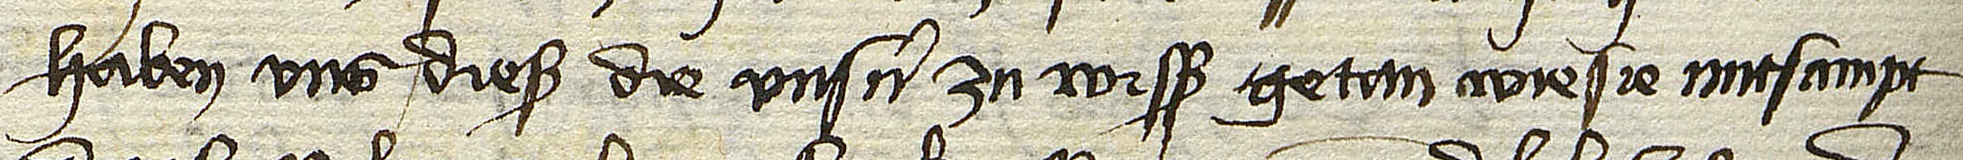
haben vns dieſ* die vnſ*n ʒu wiſſ* getan wie ſie mitſampt
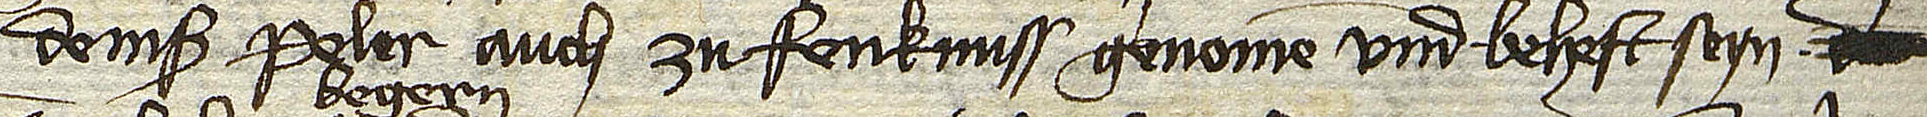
demſ* Peler auch ʒu fenknuſſ genome* vnd beheft ſeyn . Dar
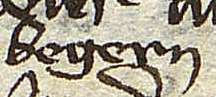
begern
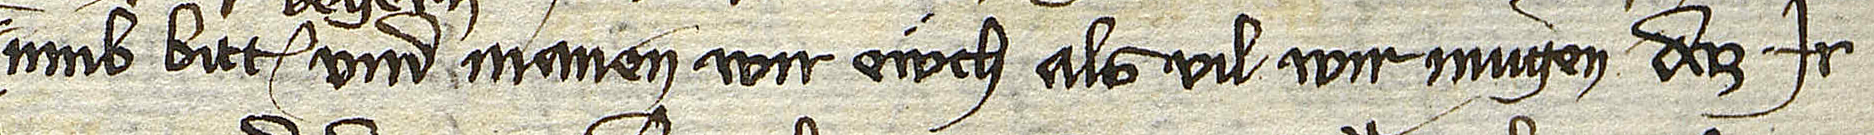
umb bitt* vnd manen wir ewch als vil wir mugen / daʒ Ir
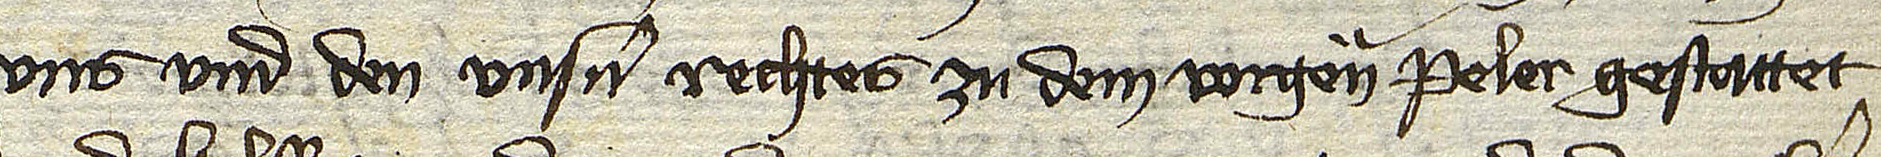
vns vnd den vnſ*n rechtes ʒu dem vorgen* Peler geſtattet
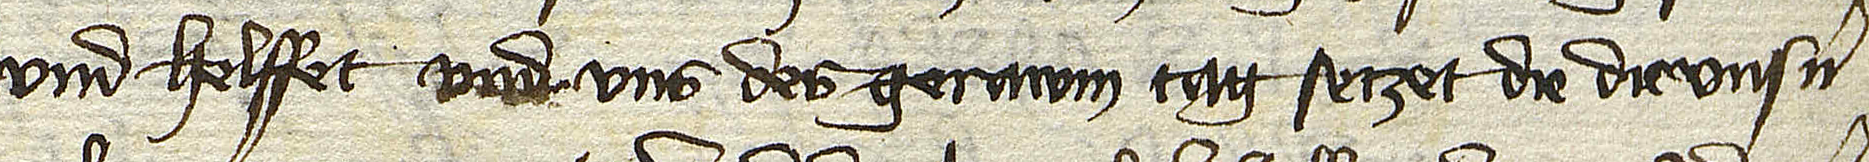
vnd helffet vnd vns des gerawm tag ſecʒet die die vnſ*n
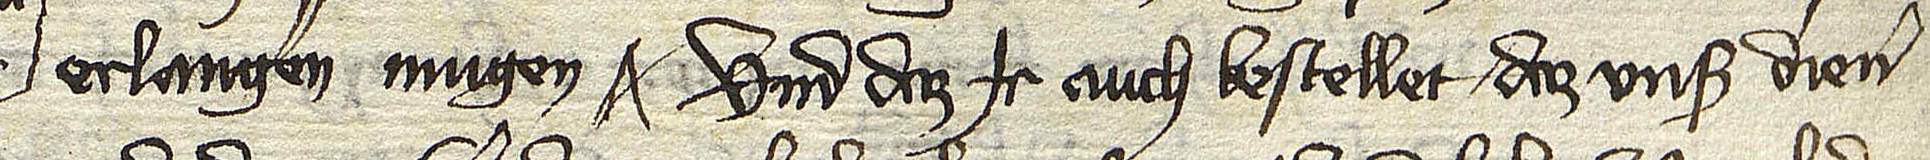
erlangen mugen / Vnd daʒ Ir auch beſtellet / daʒ vnſ* dien*
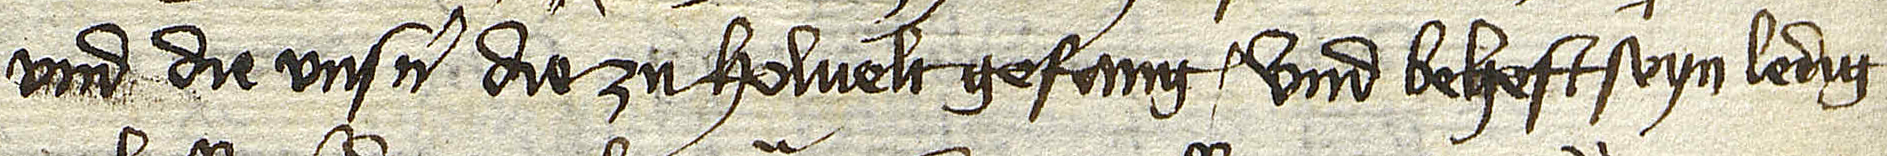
vnd die vnſ*n die ʒu holuelt gefang* Vnd beheft ſeyn ledig
